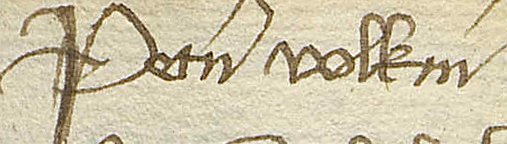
Pet*n volkm*
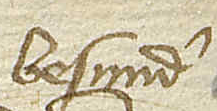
beſund*
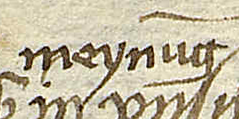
meynug*
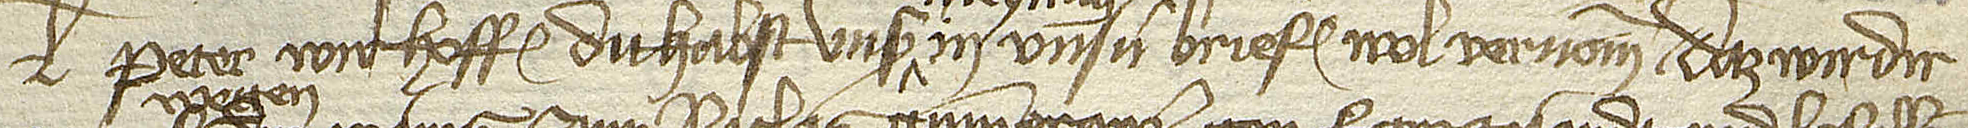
L* Peter wir hoff* du habſt vnſ* in vnſ*n brief* wol vernom* / Daʒ wir dir
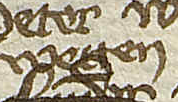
wegen
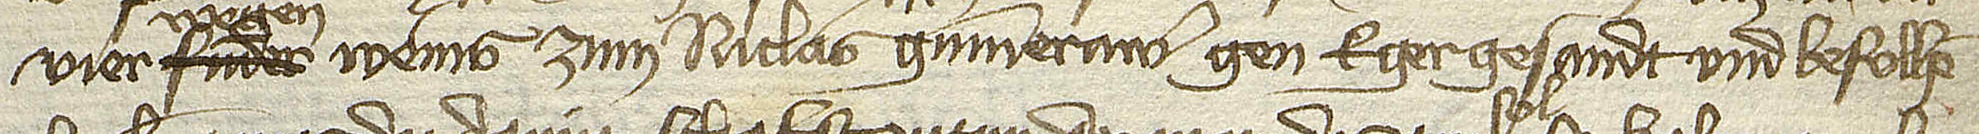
vier fuder weins ʒum Niclas gum*eraw* gen Eger geſandt vnd befolhe*
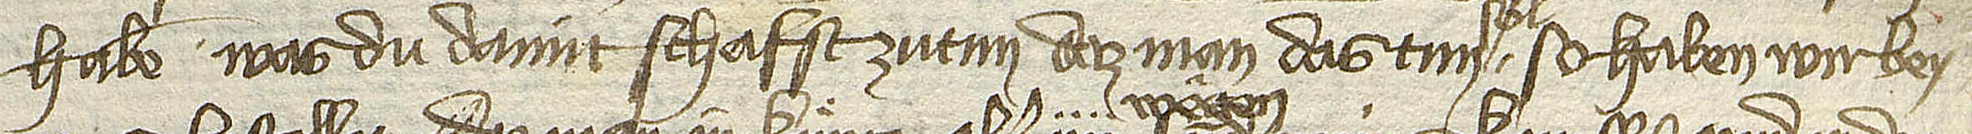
habe* . was du damit ſchafſt ʒutun daʒ man das tun / ſo haben wir bey
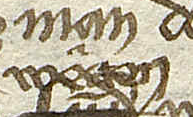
wëgen
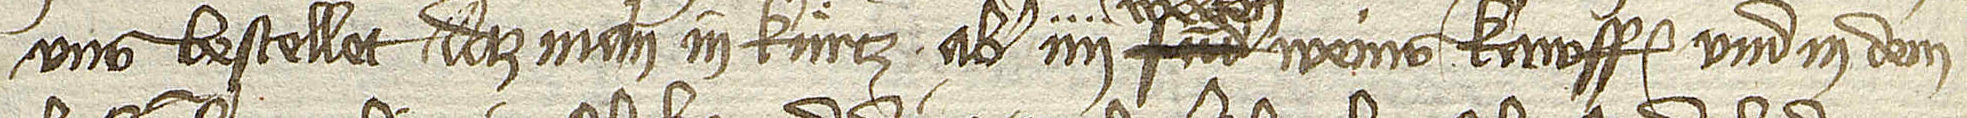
vns beſtellet / daʒ man in kürcʒ . ab* iiii fud* weins kawff* vnd in dem
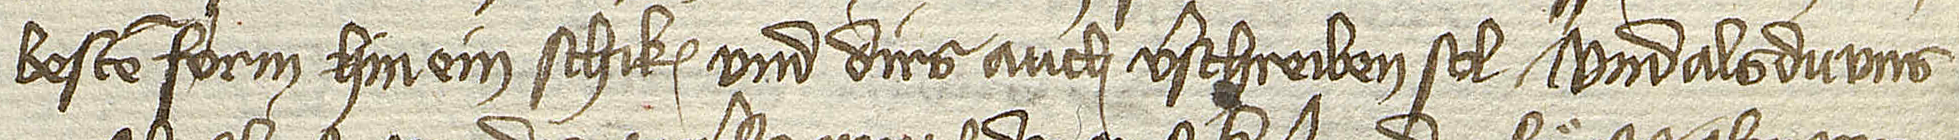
beſte* form hin ein ſchik* vnd dirs auch v*ſchreiben sol / Vnd als du vns
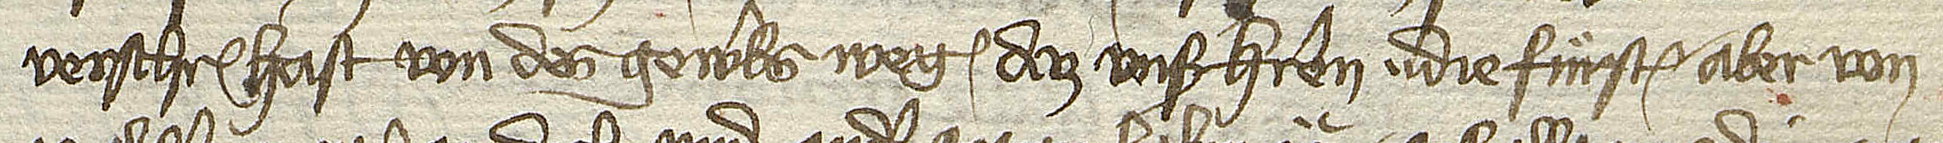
verſchr* haſt von des gewbs* weg* daʒ vnſ* hr*en ~ die fürſt* aber von
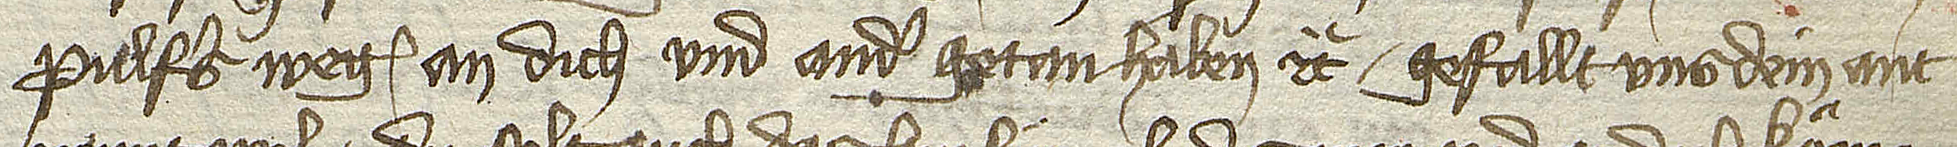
Pulf*s weg* an dich vnd and* getan haben ec* / gefallt vns dein ant =
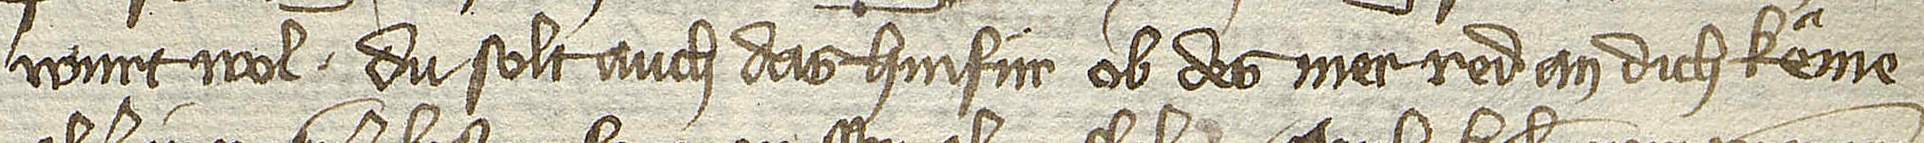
wurt wol . du ſolt auch das hinfür ob des mer red an dich këme
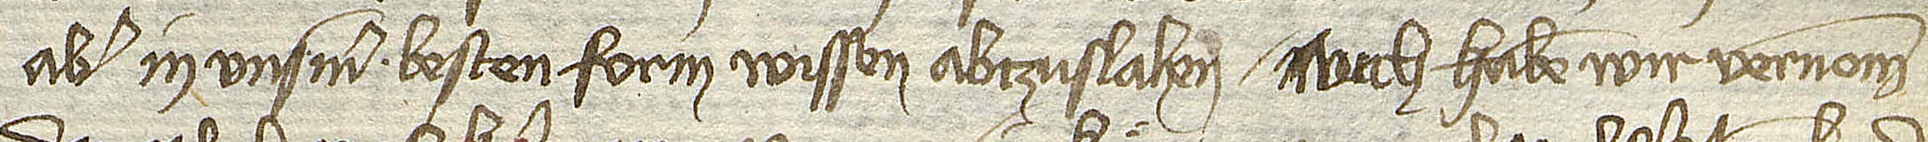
ab* in vnſ*m . beſten form wiſſen abcʒuſlahen / Auch habe* wir vernom*
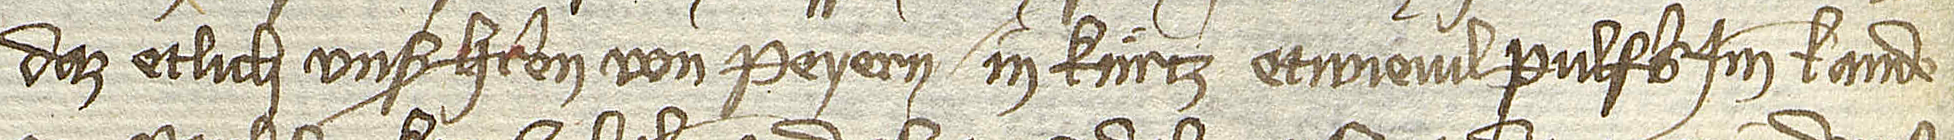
daʒ etlich vnſ* h*ren von Peyern / in kürcʒ etwieuil Pulf*s Im* lande
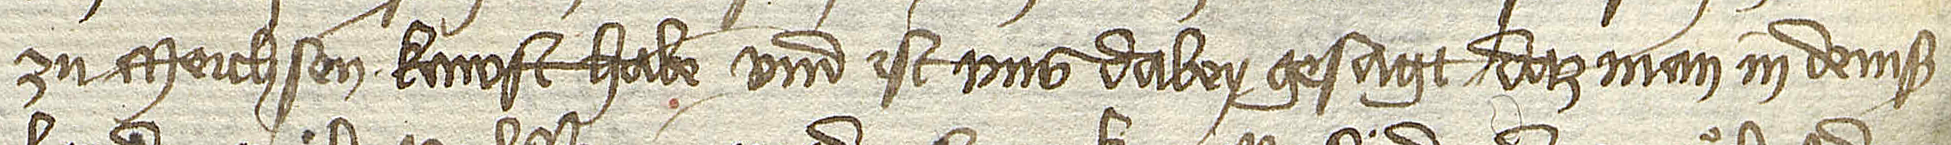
ʒu Meichſen . kawft habe* vnd iſt vns dabey geſagt / daʒ man in demſ*
